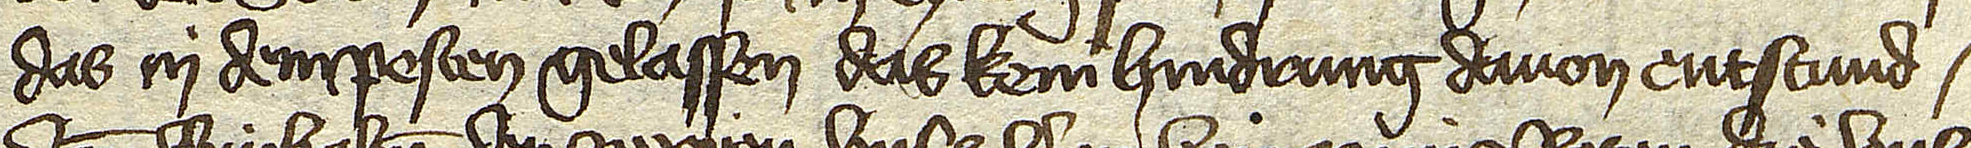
das in dem peſten gelaſſen das kein hindrung dauon entſtund /
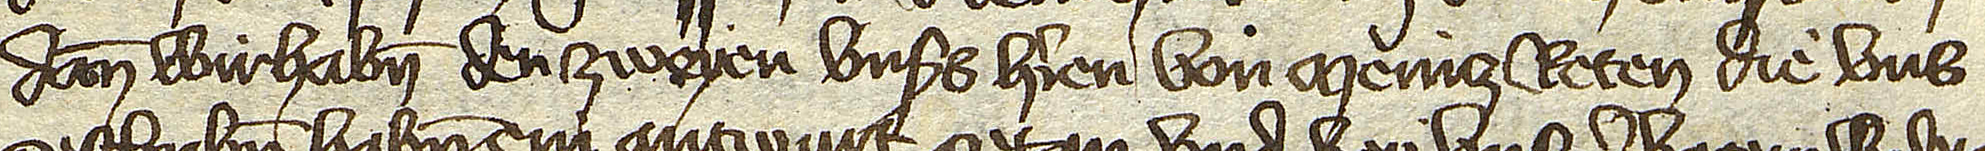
dan* wir habn* den cʒweyen vnſ*s h*ren von Meincʒ Reten die vns
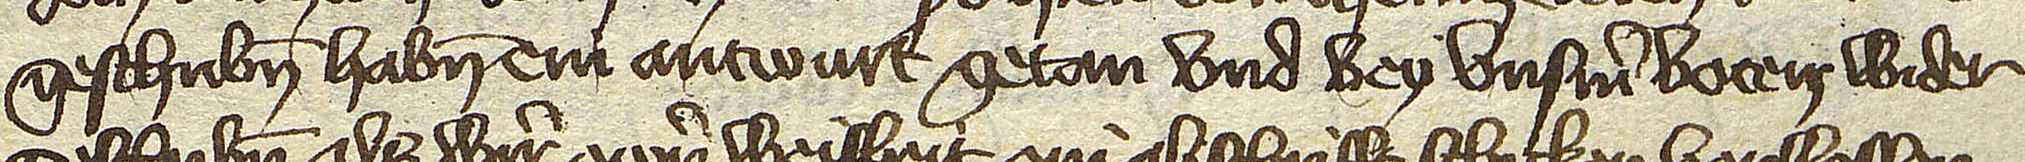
geſchribn* habn* ein antwurt getan vnd bey vnſm* boten wider
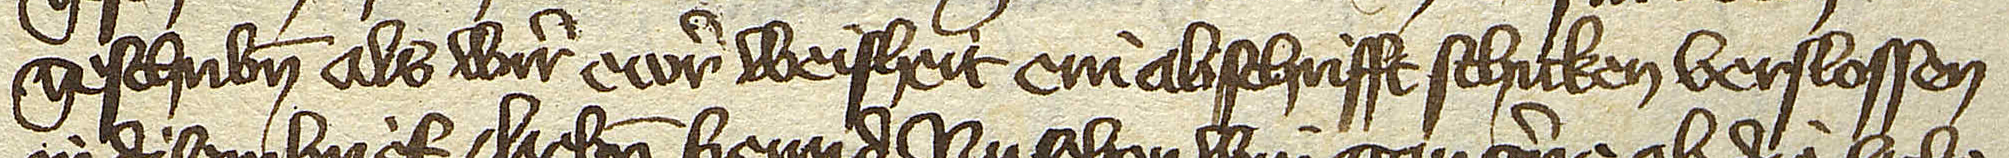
geſchribn* als wir ewr* weiſheit ein abſchrifft ſchicken verſloſſen
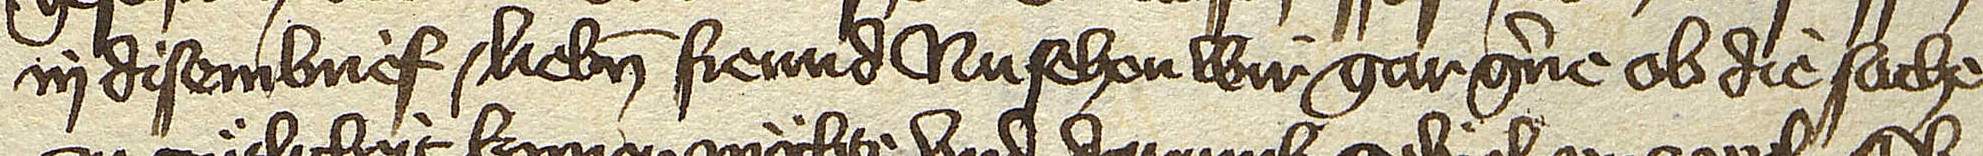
in diſem brief / liebn* freund Nu ſehen wir gar g*ne ob die ſache
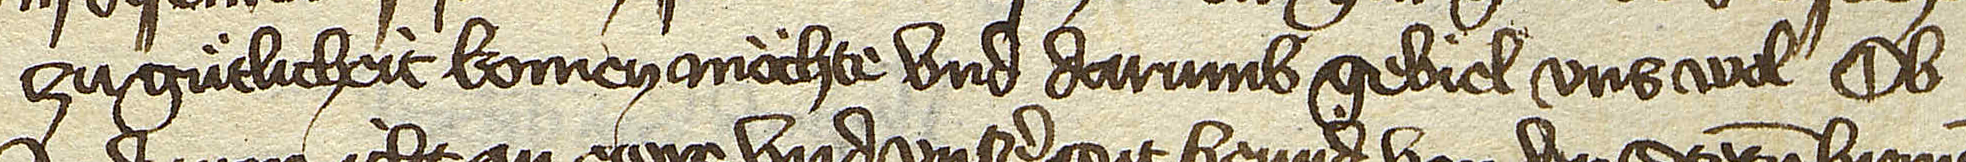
cʒu gütlicheit komen möchte vnd darumb geviel vns wol Ob
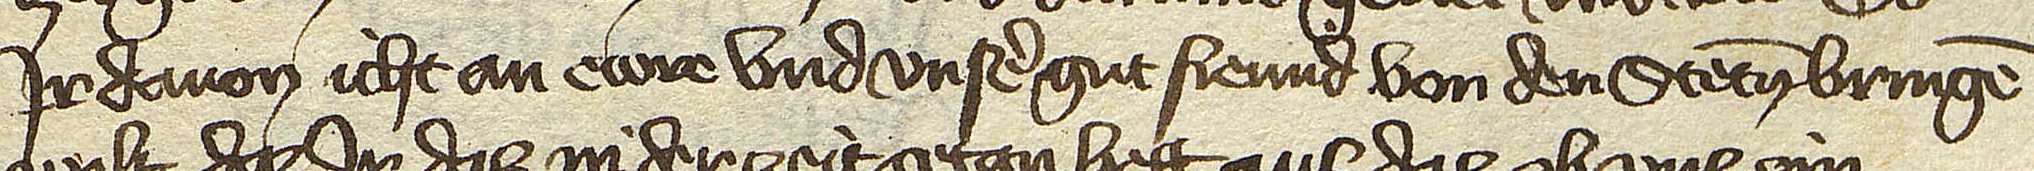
Ir dauon icht an ewre vnd vnſe* gut freund von den Stetn* bringe*
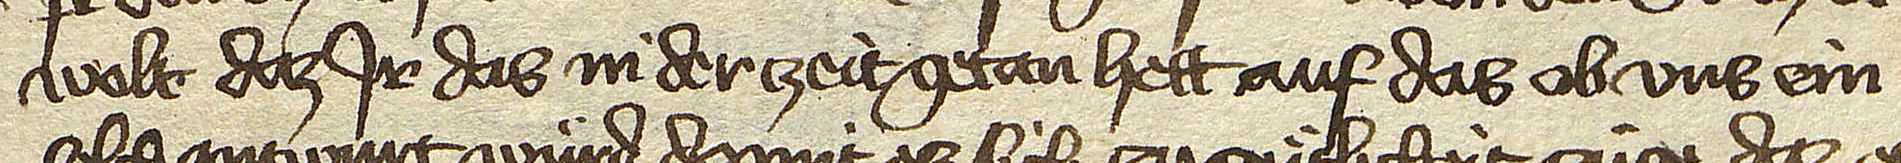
wolt daʒ Ir das in der cʒeit getan hett auf das ob vns ein
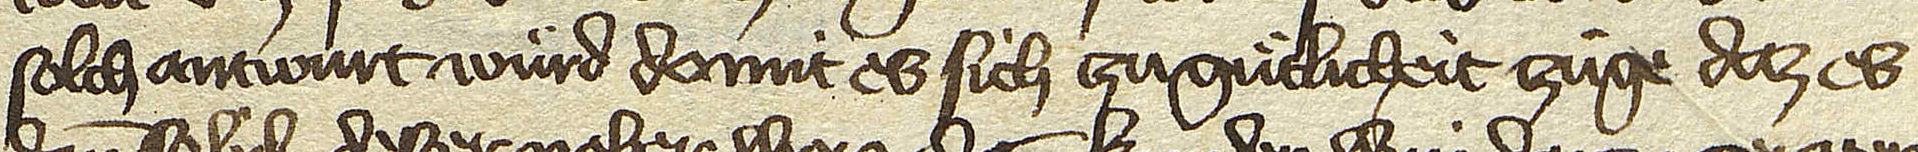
ſolch antwurt würd domit es ſich cʒu gütlicheit cʒüge daʒ es
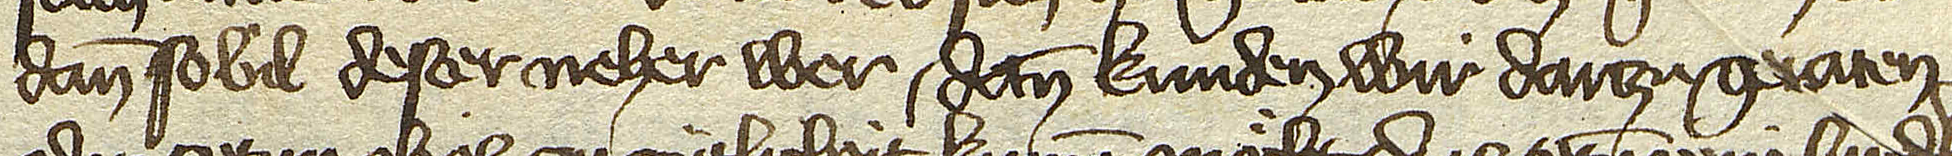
dan* ſovil deſter neher wer / dan* kunden wir darcʒu geraten
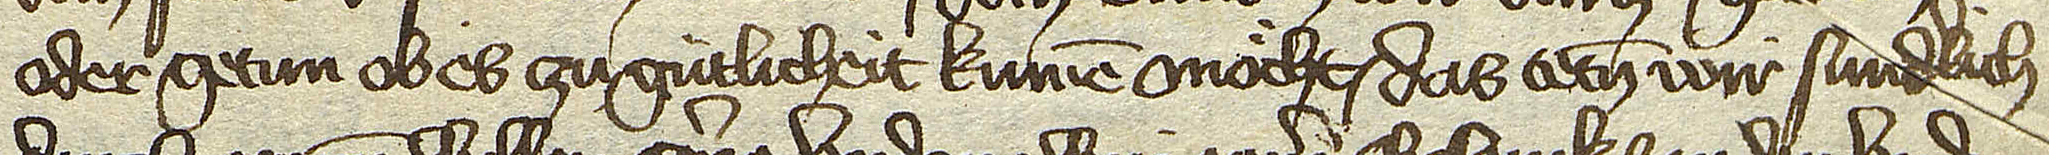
oder getun ob es cʒu gütlicheit kume* möcht / das tetn* wir ſund*lich
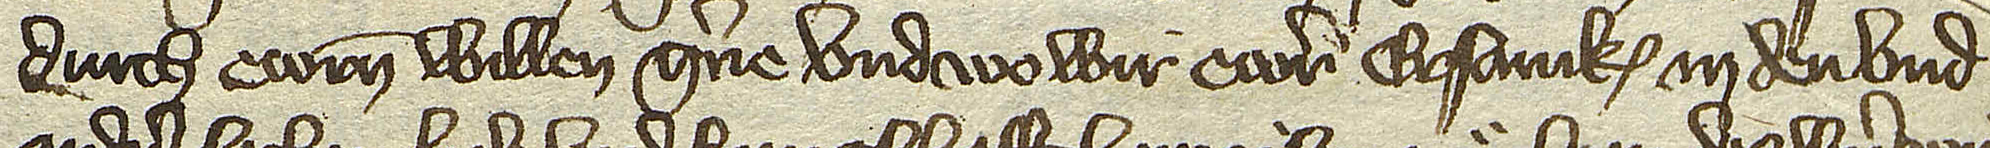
durch ewrn* willen g*ne vnd wo wir ewr* Erſamk* in den vnd
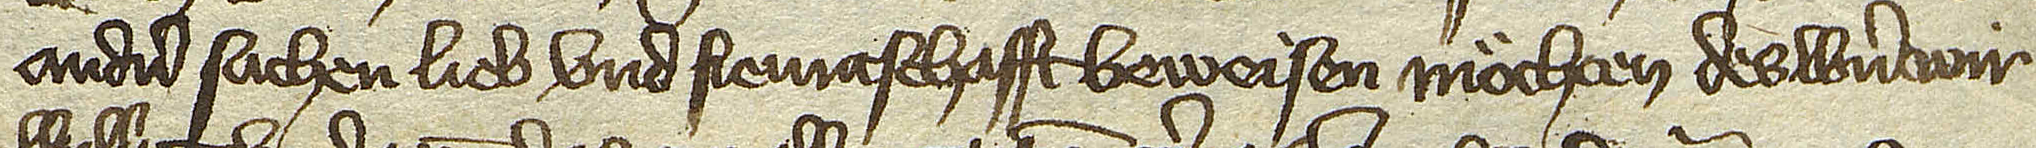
andn* ſachen lieb vnd freuntſchafft beweiſen möchten des wn* wir
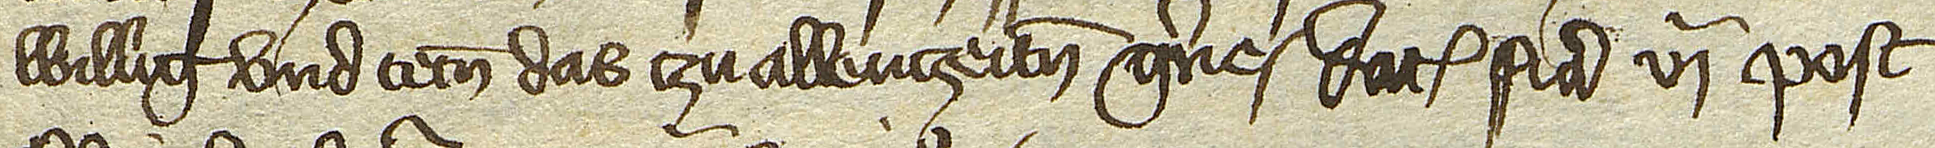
willig vnd tetn* das cʒu allencʒeitn* g*ne / dat* fia* vi* poſt
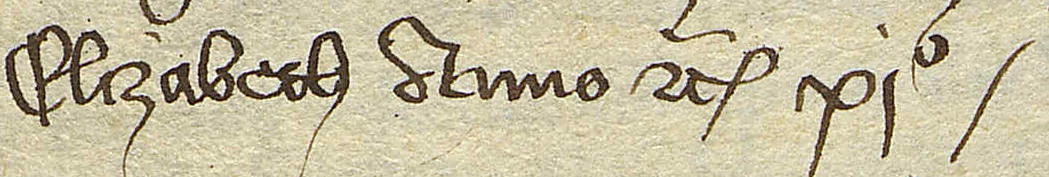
Eliʒabeth Anno ec* xi* /
